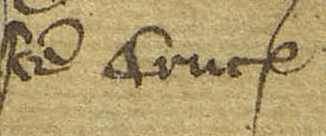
ſce* Cruce
